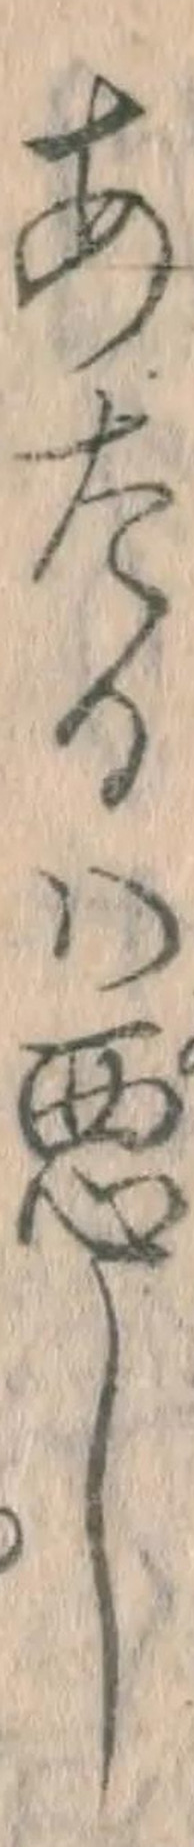あたるは悪し
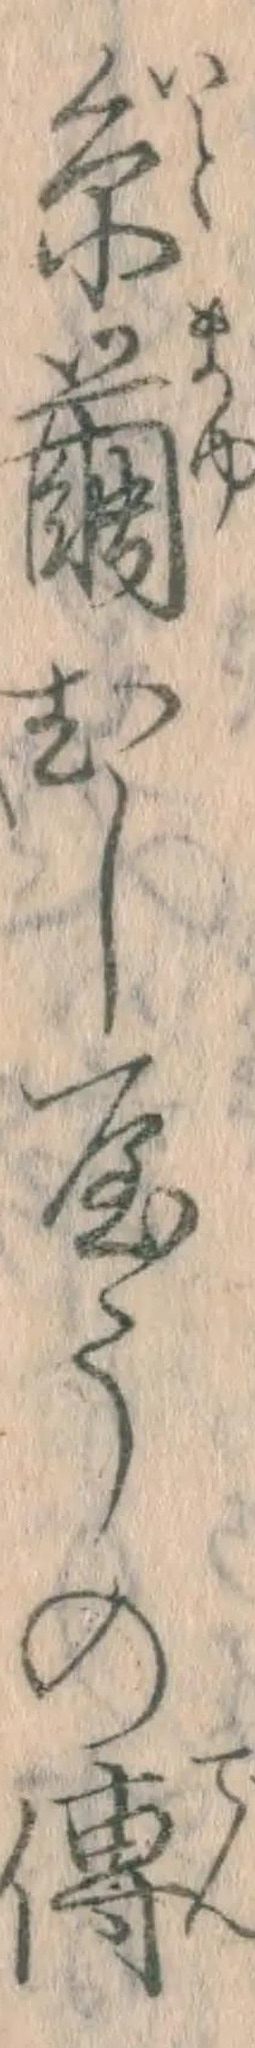糸繭むしやうの伝
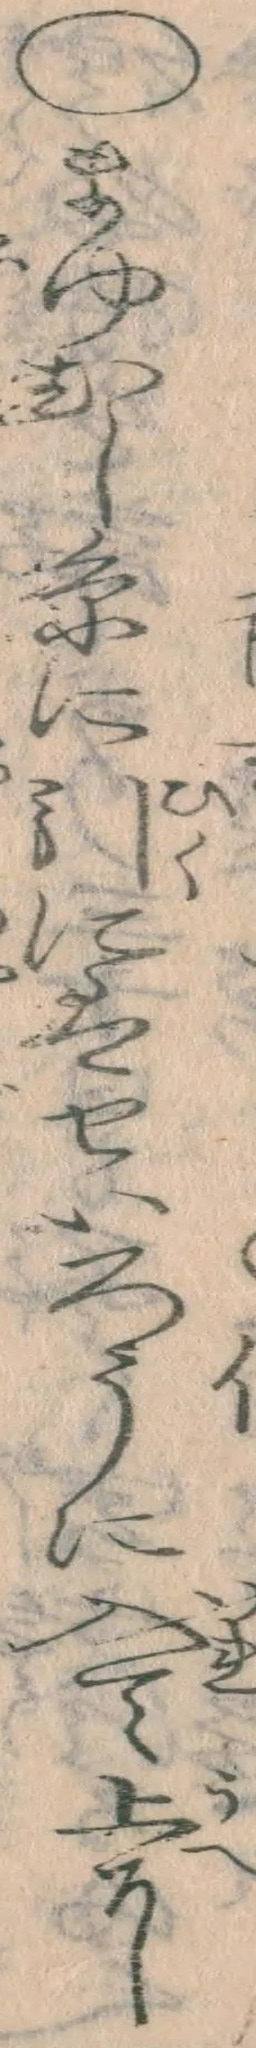○まゆむし糸に引にはせいろうに入て上に
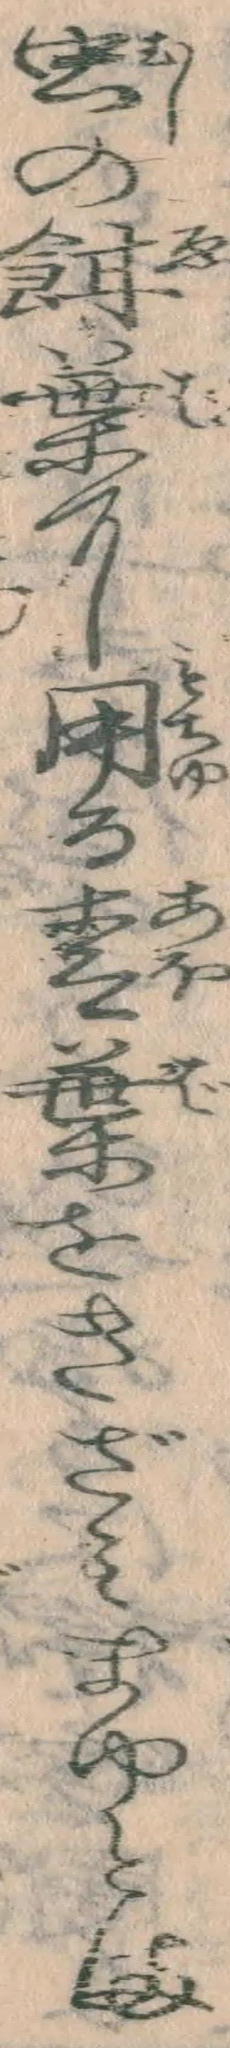虫の餌葉に用る青葉をきざみまゆとま
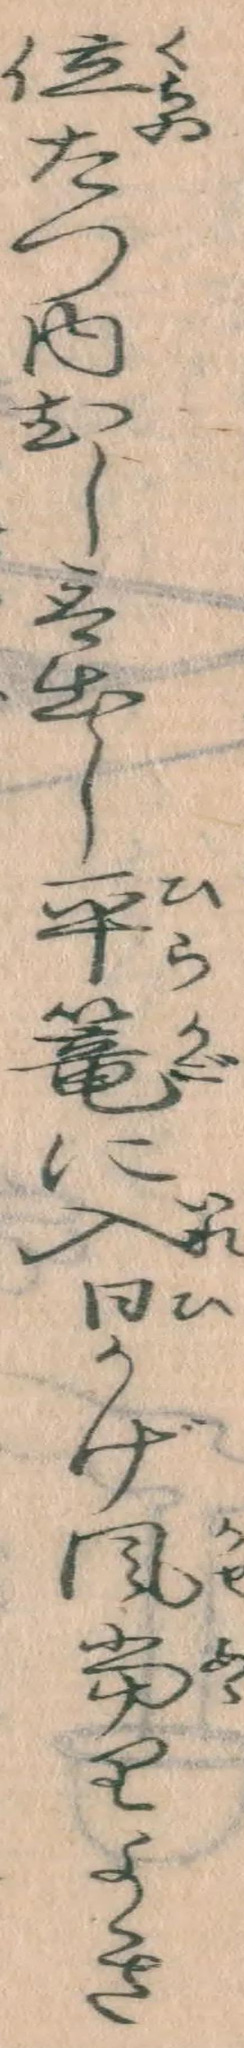位たつ内むし取出し平篭に入日かげ風当りよき
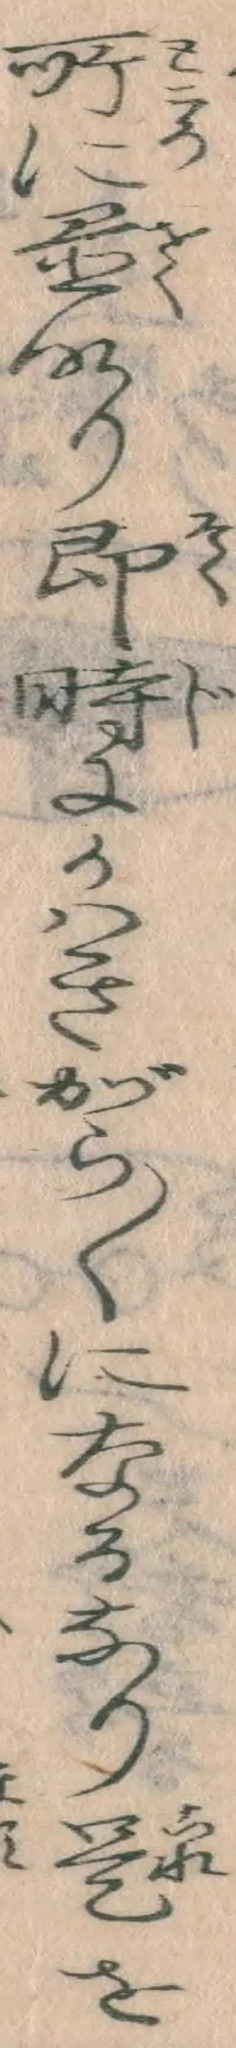所に置なり即時にかはきがら〳〵になるなり是を
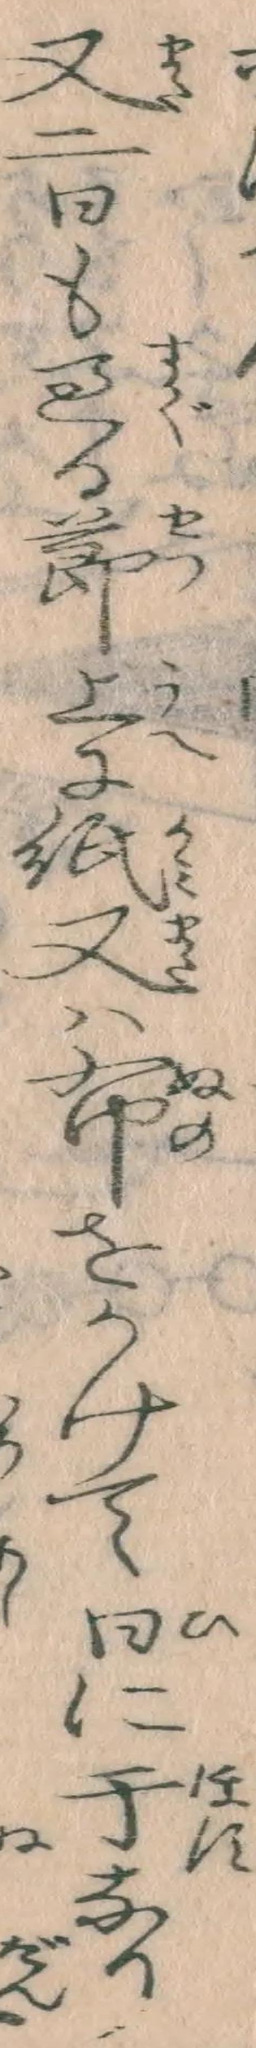又二日も過る節上に紙又は布をかけて日に干なり
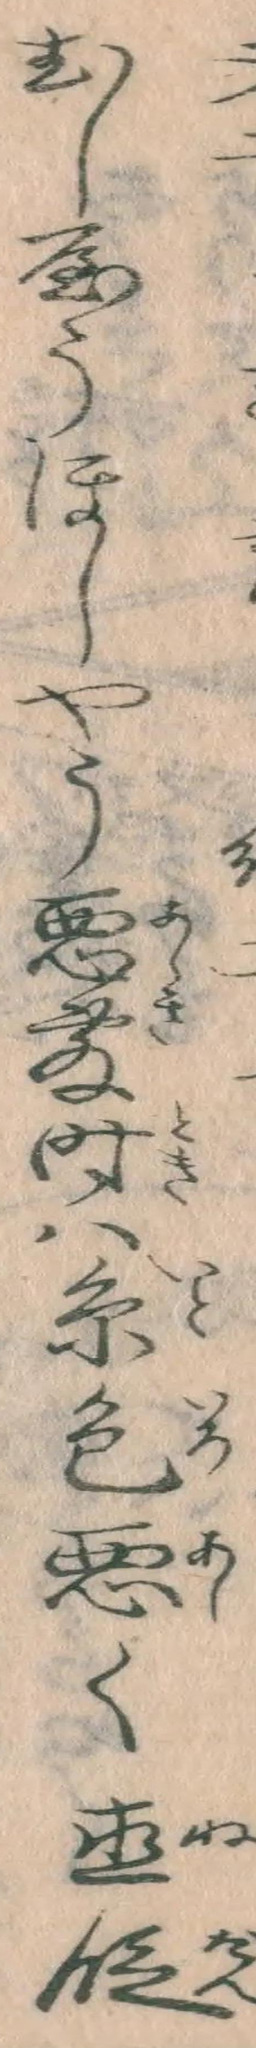むしやうほしやう悪敷時は糸色悪く直段
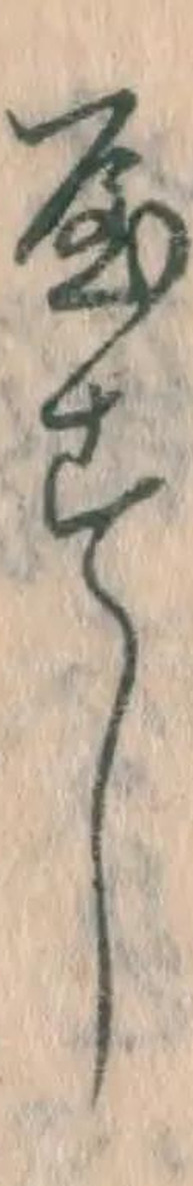やすし
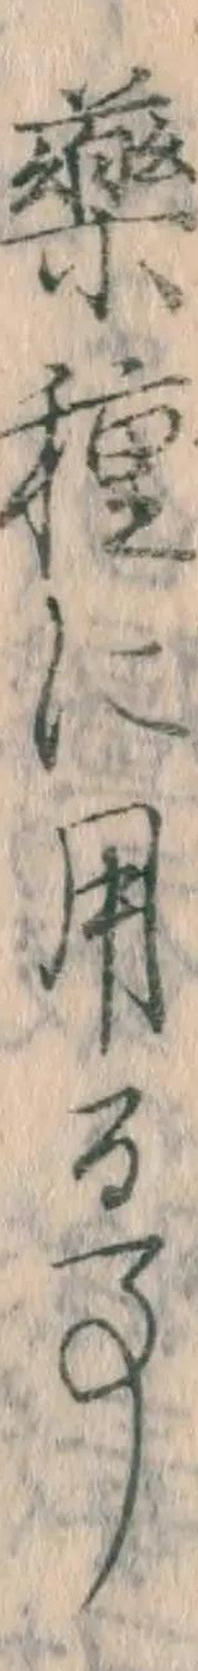薬種に用る事
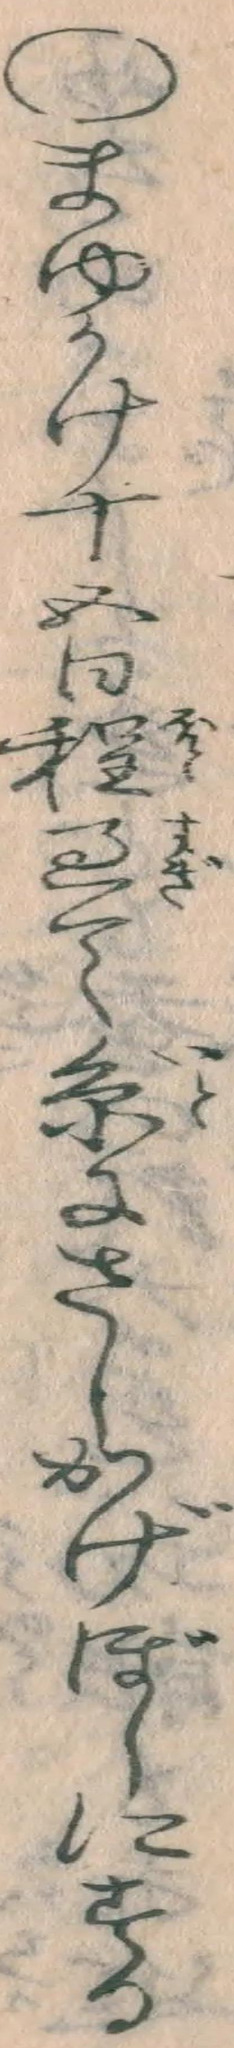○まゆかけ十五日程過て糸にさしかげぼしにする
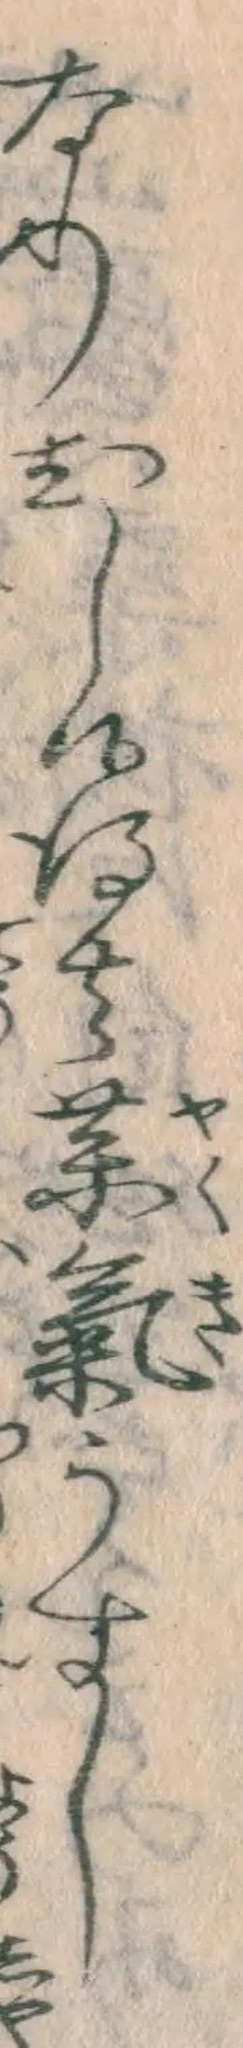なりむし候後其薬気うすし
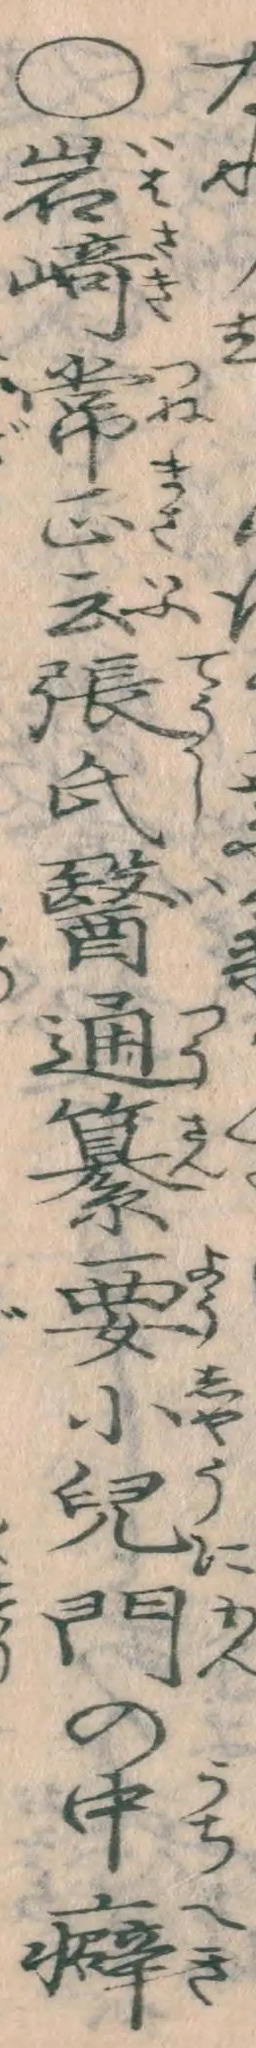○岩崎常政云張氏医通纂要小児門の中癖

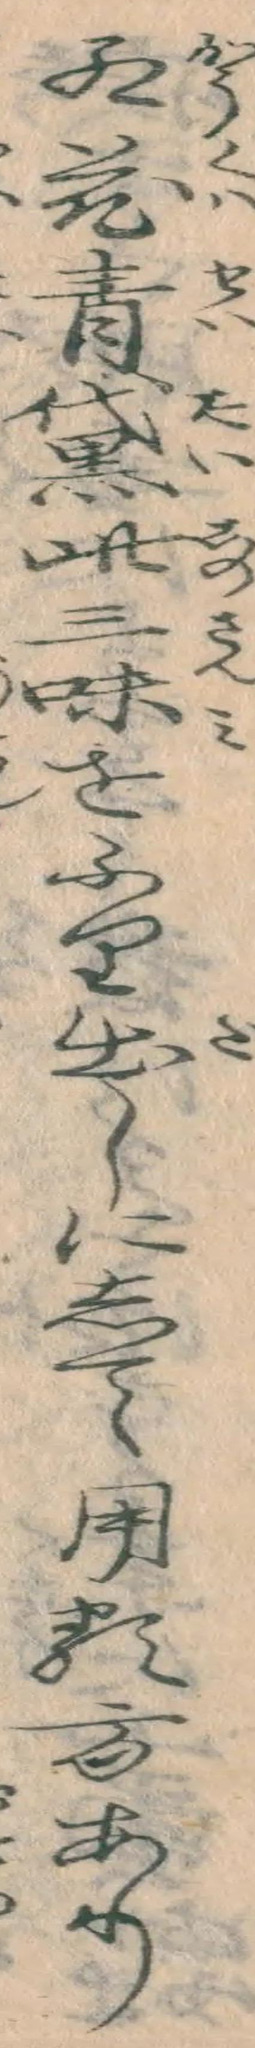紅花青黛此三味をふり出しにして用る方あり
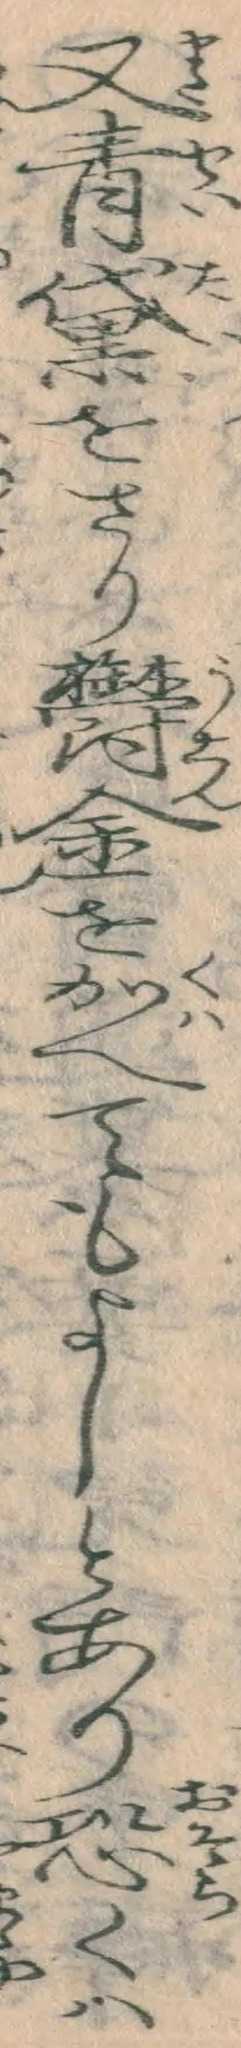又青黛をさり鬱金を加へてもよしとあり恐くは
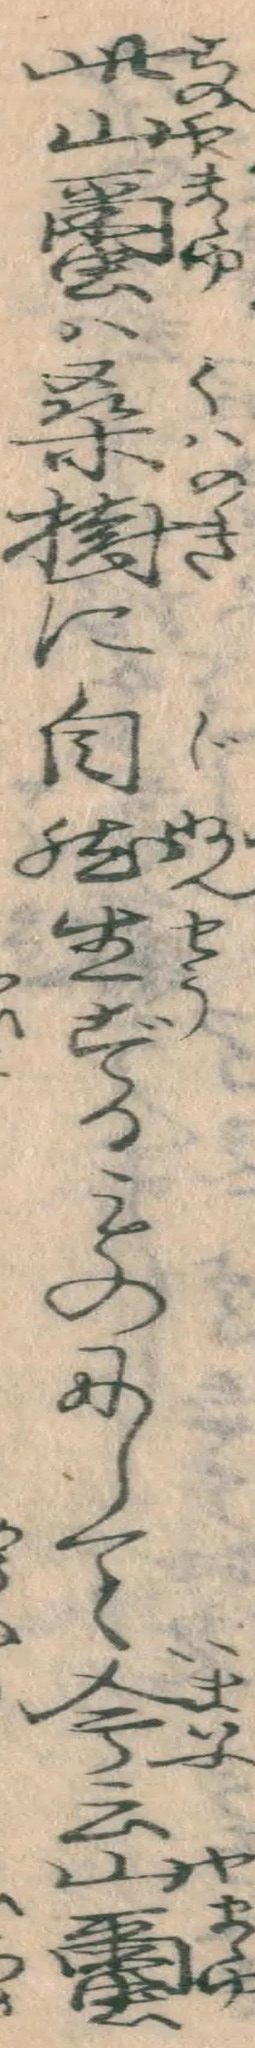此山繭は桑樹に自然生ずるものにして今云山繭
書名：山繭養法秘傳抄
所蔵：国立国会図書館 National Diet Library, JAPAN
